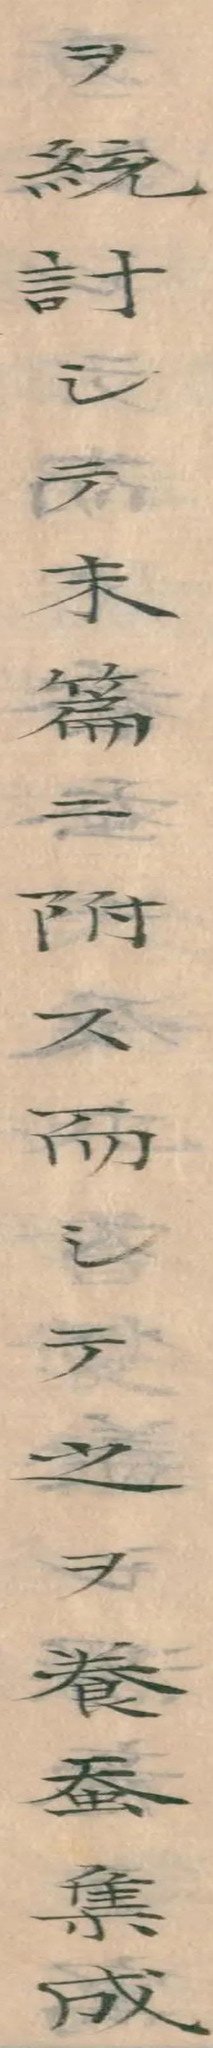ヲ統計シテ末篇ニ附ス而シテ之ヲ養蚕集成
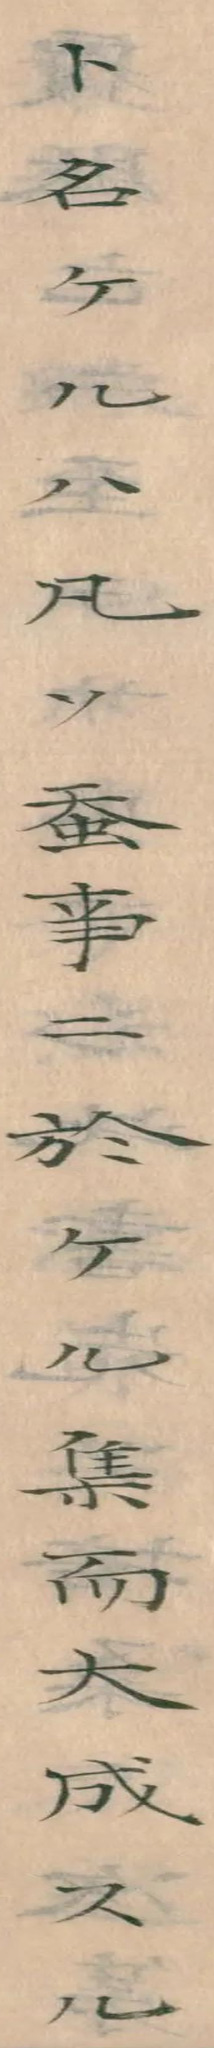ト名ケルハ凡ソ蚕事ニ於ケル集而大成スル
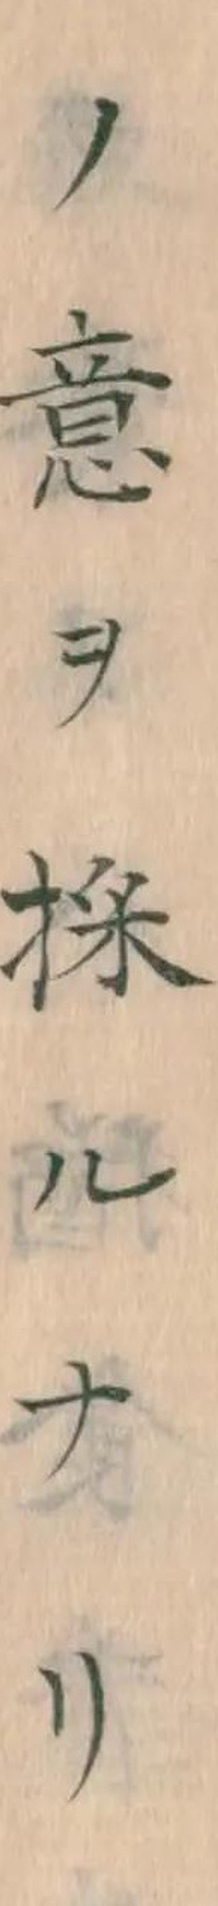ノ意ヲ採ルナリ
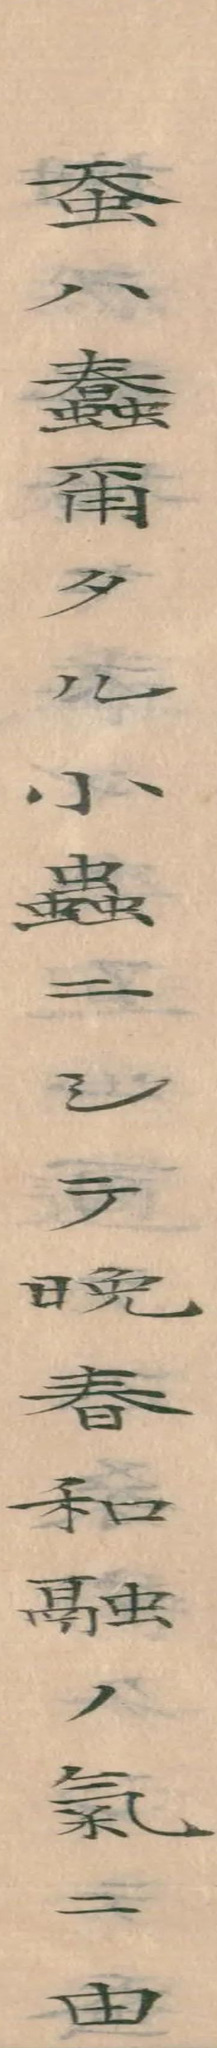一蚕ハ蠢爾タル小虫ニシテ晩春和融ノ気ニ由
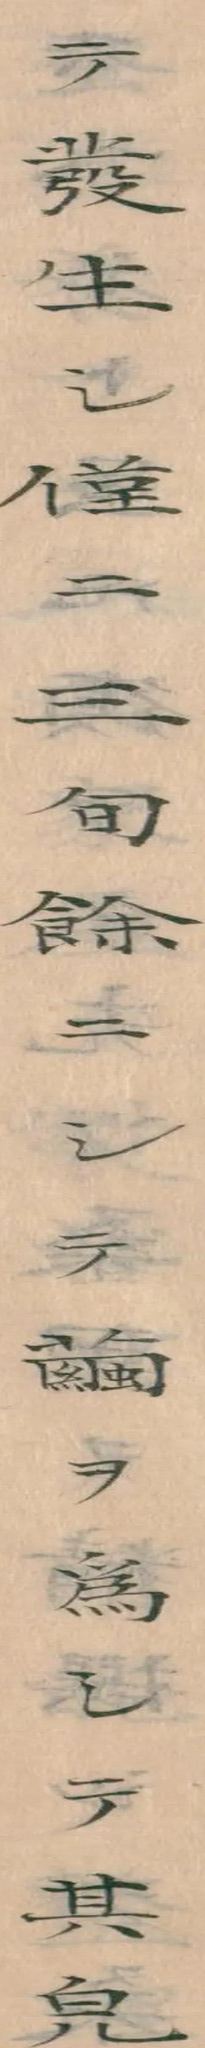テ発生シ僅ニ三旬余ニシテ繭ヲ為シテ其皃
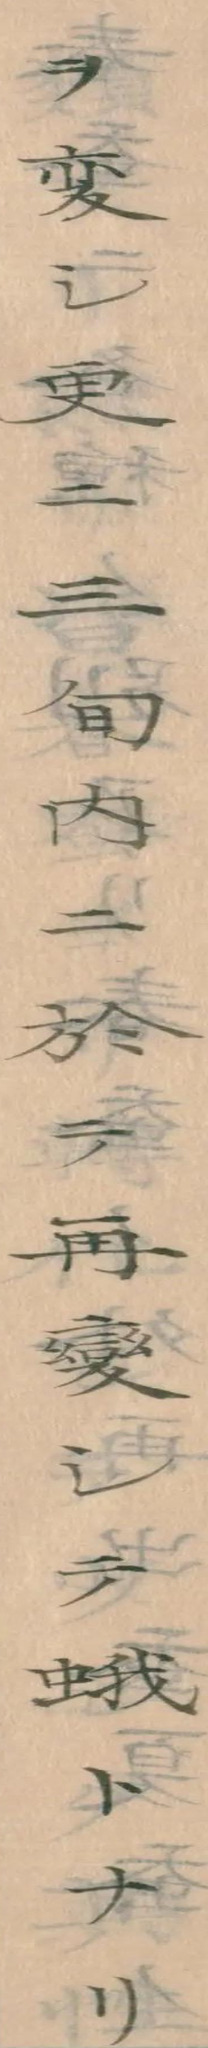ヲ変シ更ニ三旬内ニ於テ再変シテ蛾トナリ
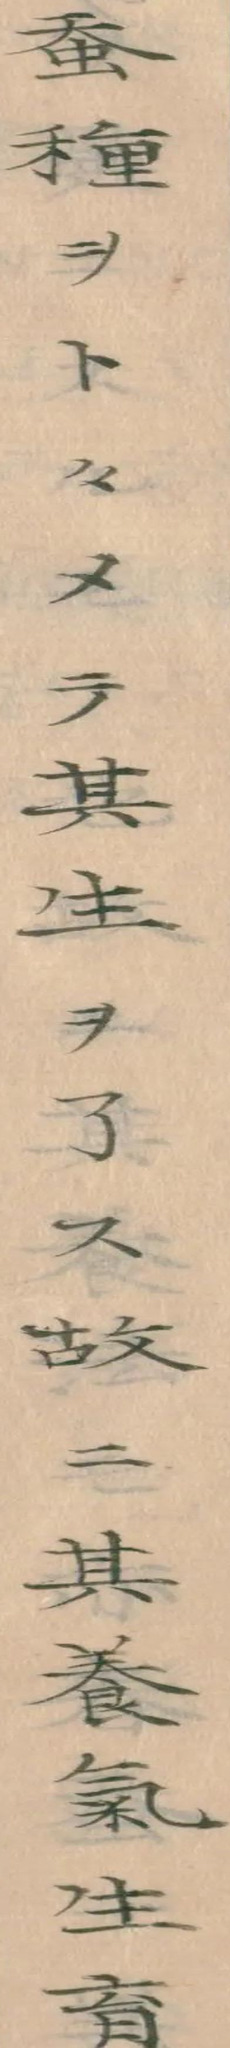蚕種ヲトヽメテ其生ヲ了ス故ニ其養気生育
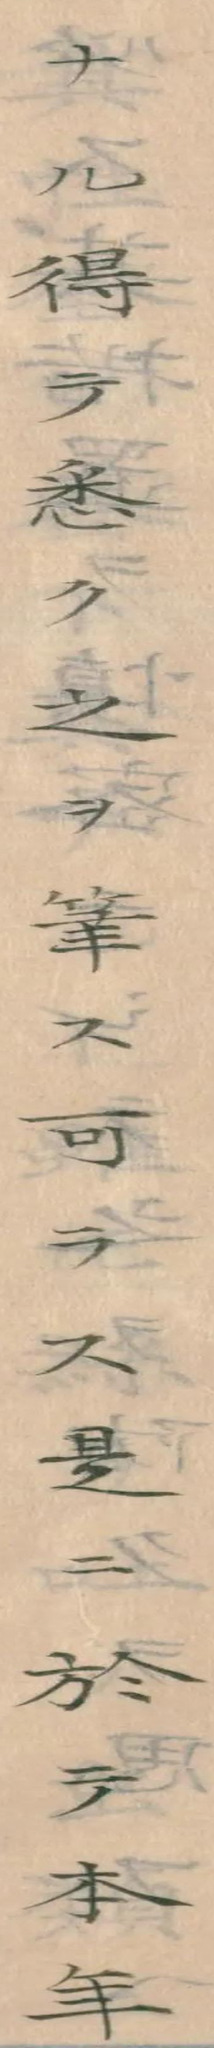ナル得テ悉ク之ヲ筆ス可ラス是ニ於テ本年
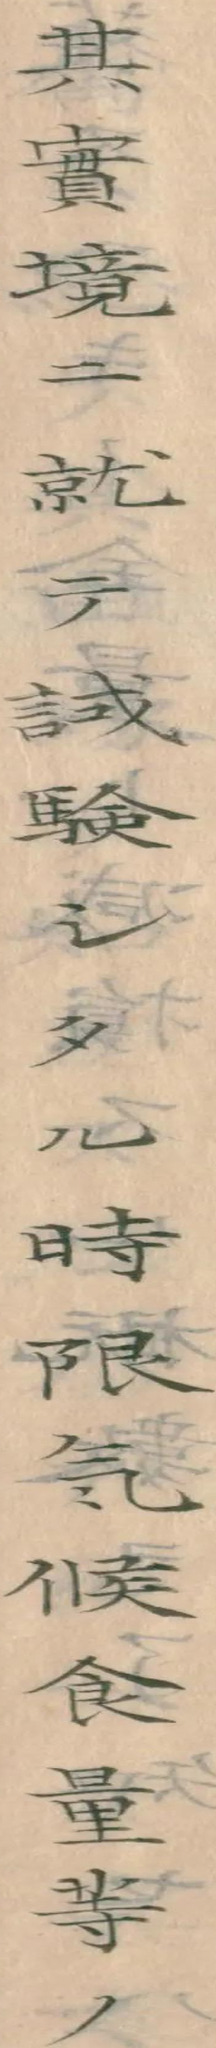其実境ニ就テ試験シタル時限気候食量等ノ
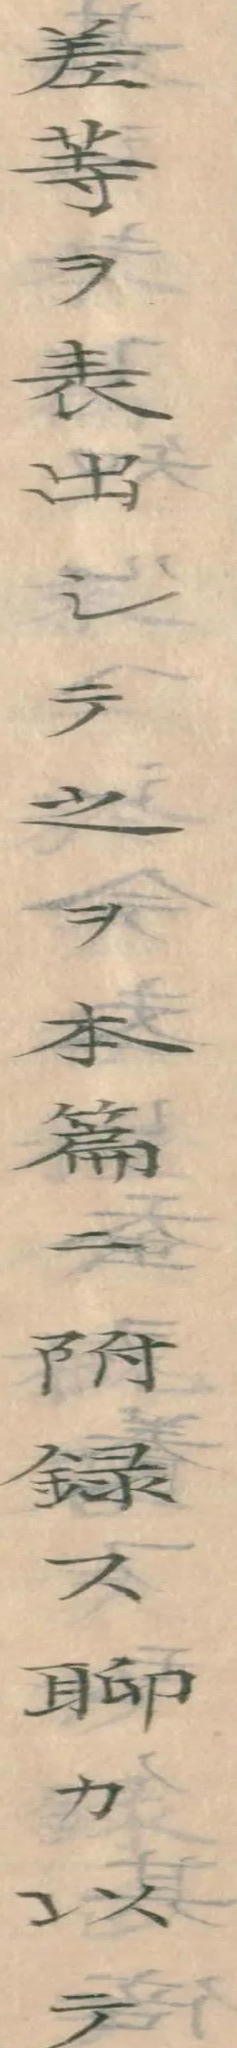差等ヲ表出シテ之ヲ本篇ニ附録ス聊カ以テ
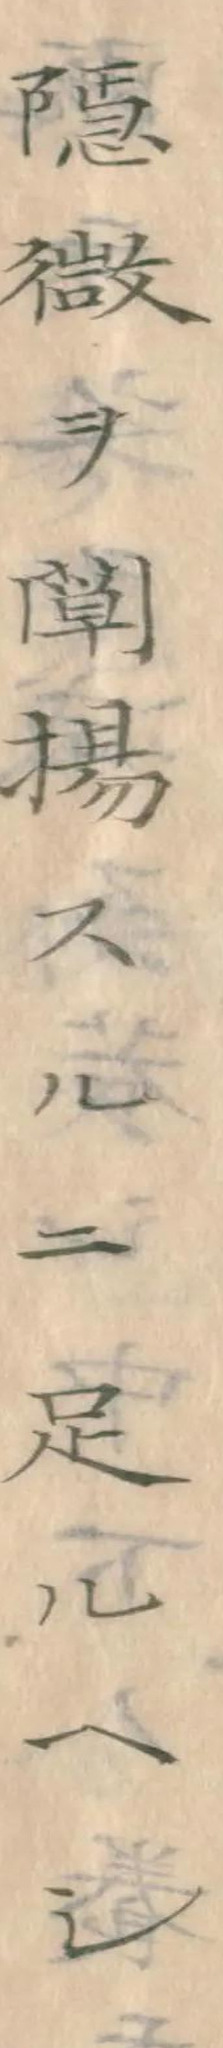隠微ヲ闡揚スルニ足ルヘシ
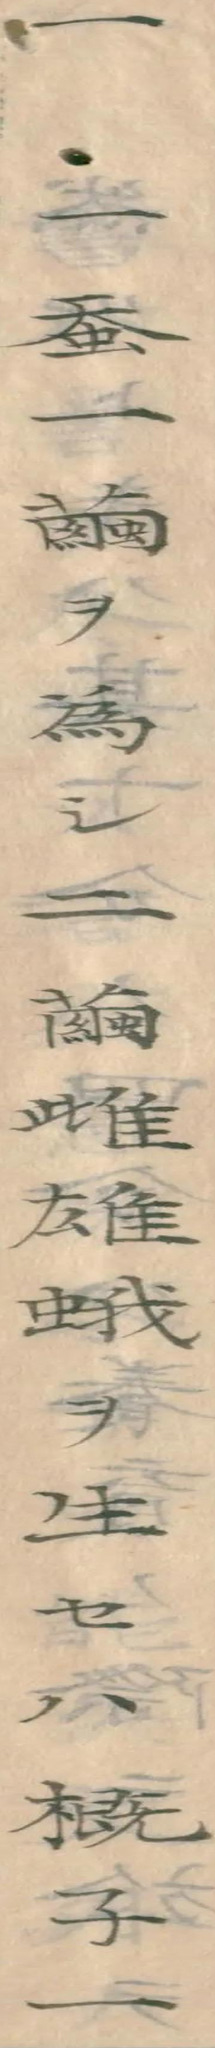一一蚕一繭ヲ為シ二繭雌雄蛾ヲ生セハ概ネ一
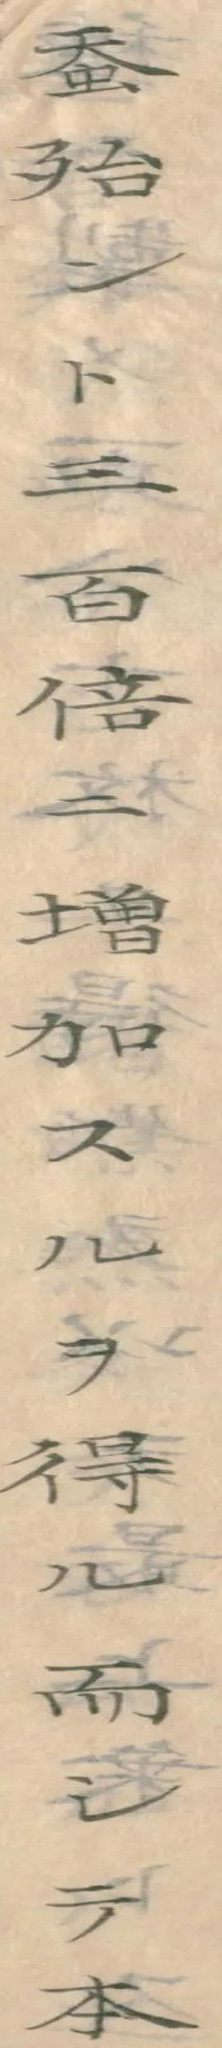蚕殆ント三百倍ニ増加スルヲ得ル而シテ本

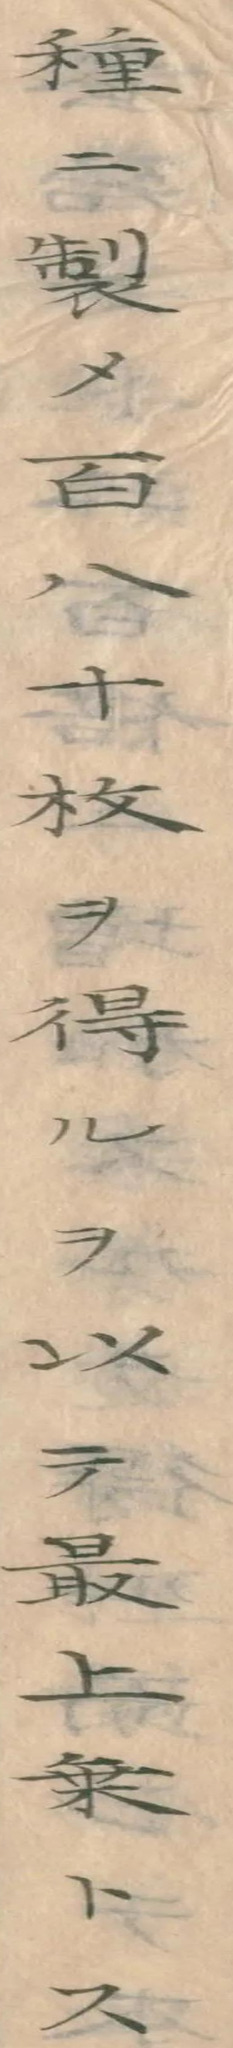種ニ製シテ百八十枚ヲ得ルヲ以テ最上乗トス
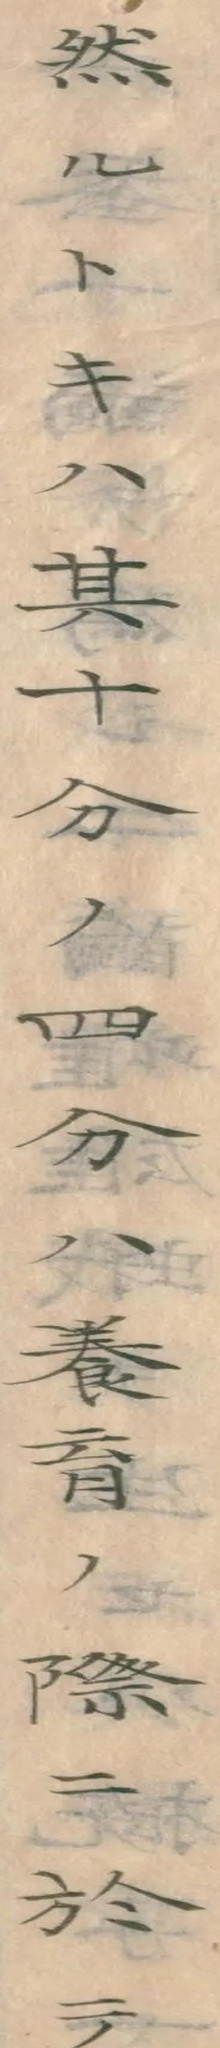然ルトキハ其十分ノ四分ハ養育ノ際ニ於テ
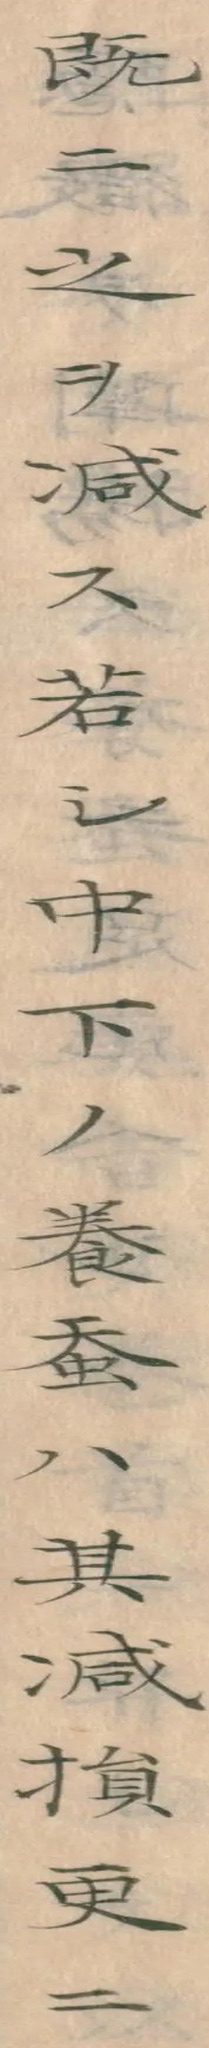既ニ之ヲ減ス若シ中下ノ養蚕ハ其減損更ニ
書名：蚕桑集成
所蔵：国立国会図書館 National Diet Library, JAPAN
